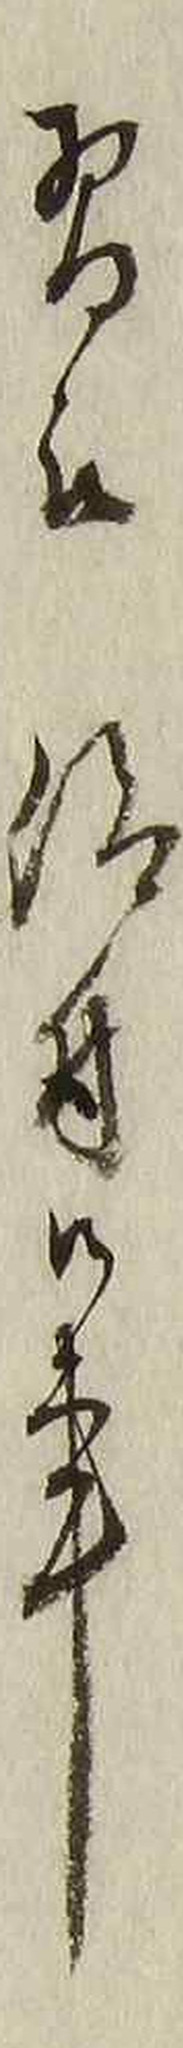習被仰付候事
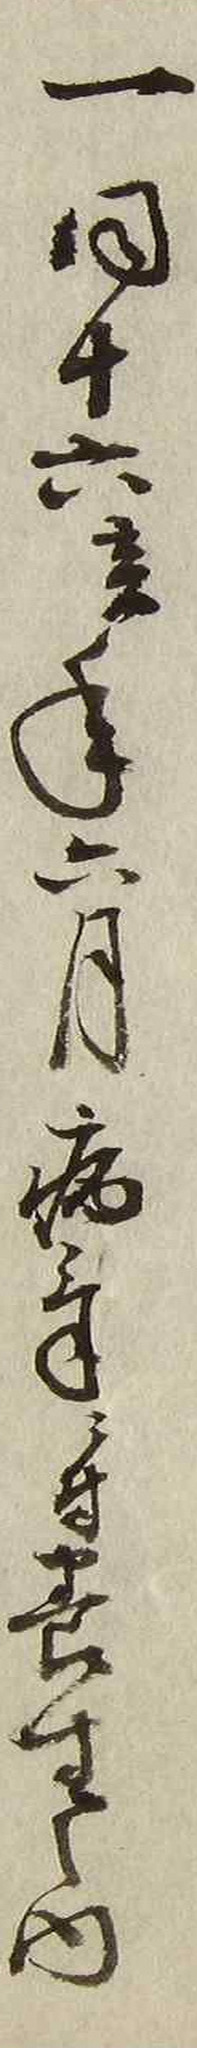一同十六亥年六月病気ニ付養生之内
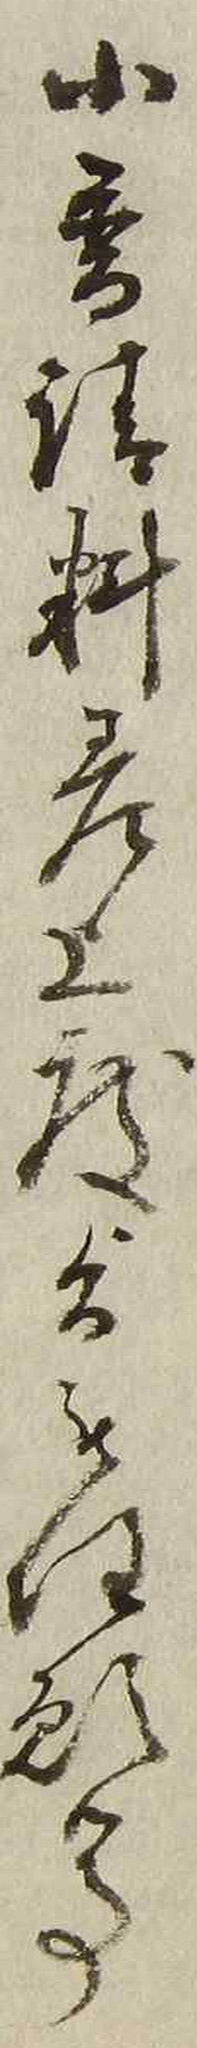小普請料差上度旨被任願候事
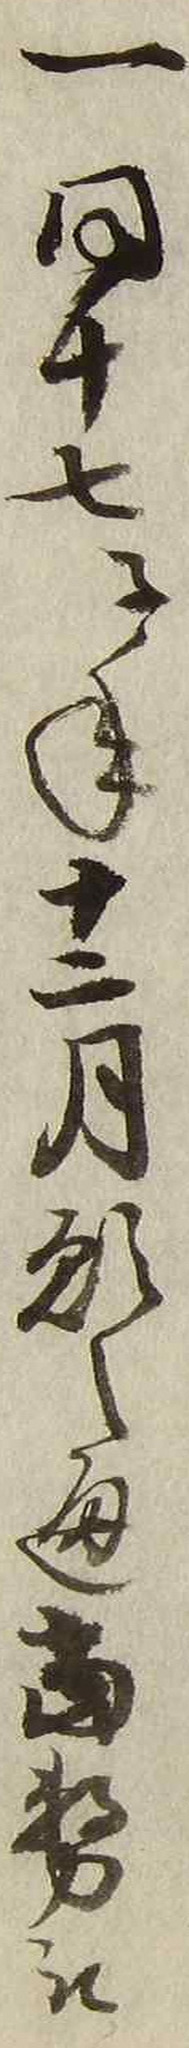一同十七子年十二月願之通当務被
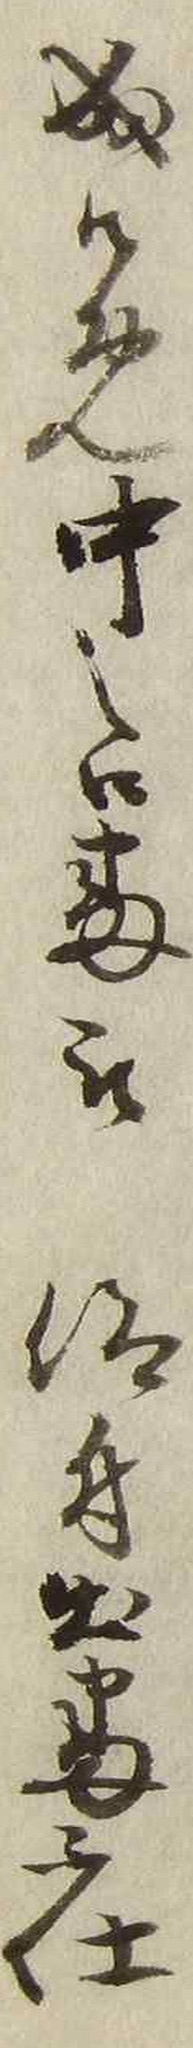成御免中之口番被仰付出番不仕

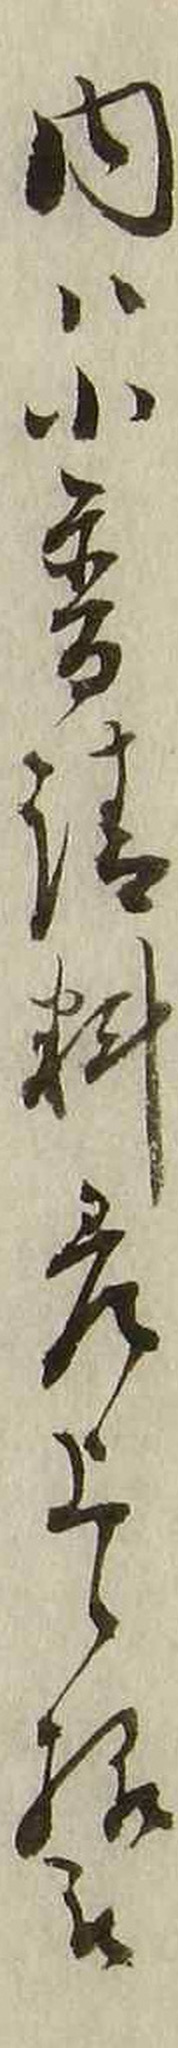内ハ小普請料差上候様被
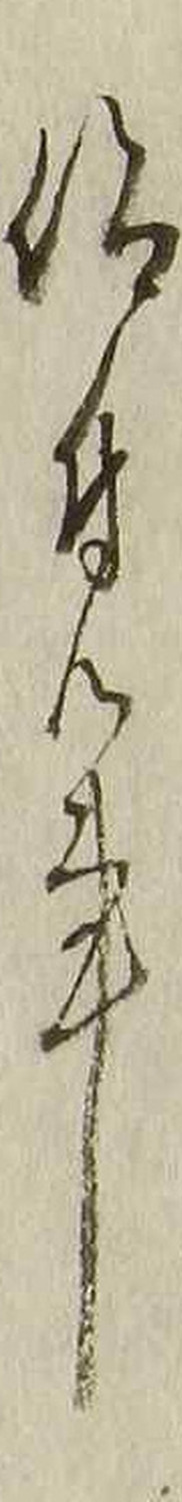仰付候事
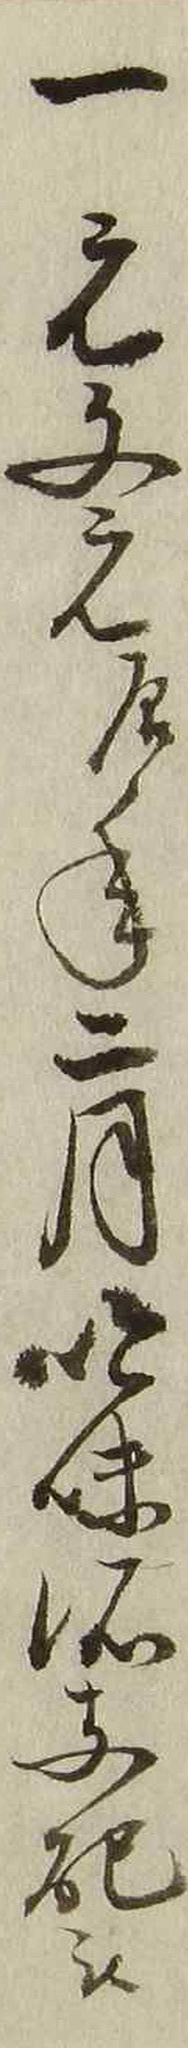一元文元辰年二月吟味所支配被
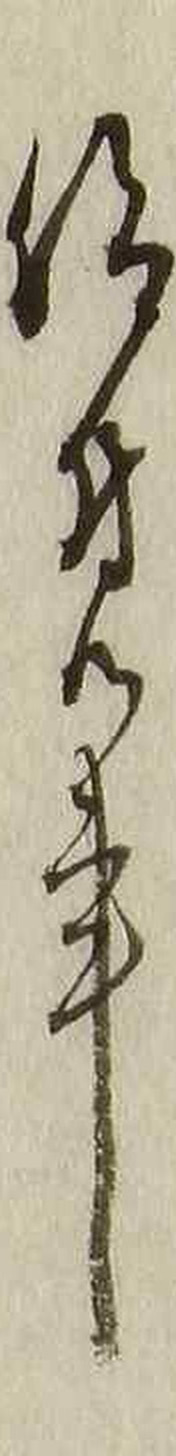仰付候事
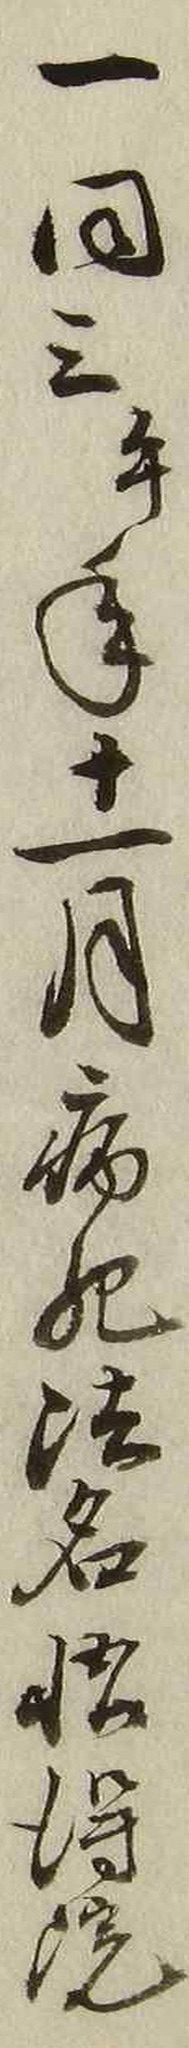一同三午年十一月病死法名悟得院
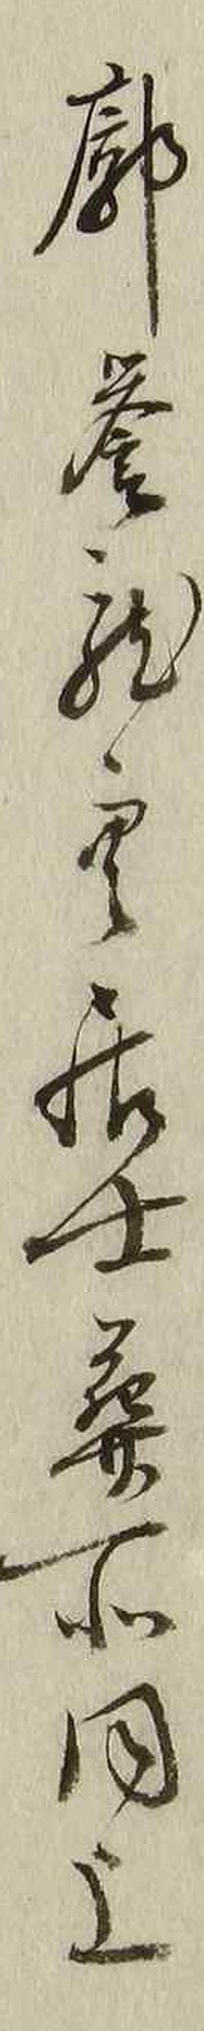廓誉龍空居士葬所同上
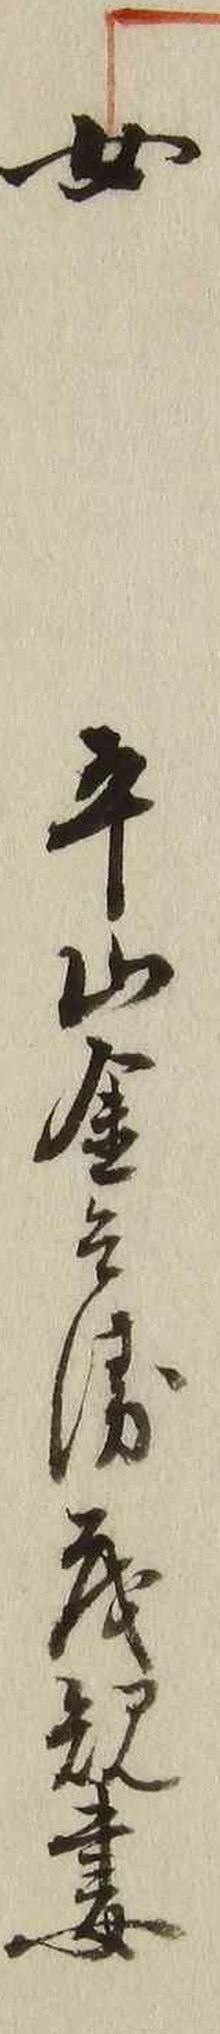女平山金兵衛茂規妻
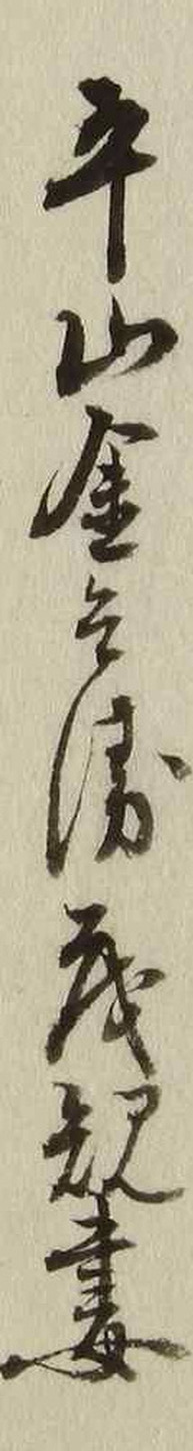女平山金兵衛茂規妻
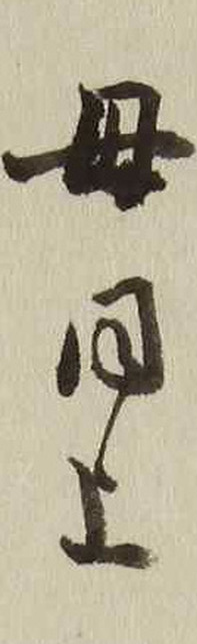母同上
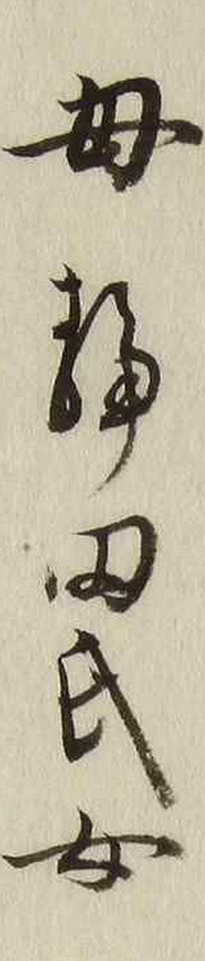母静田氏女
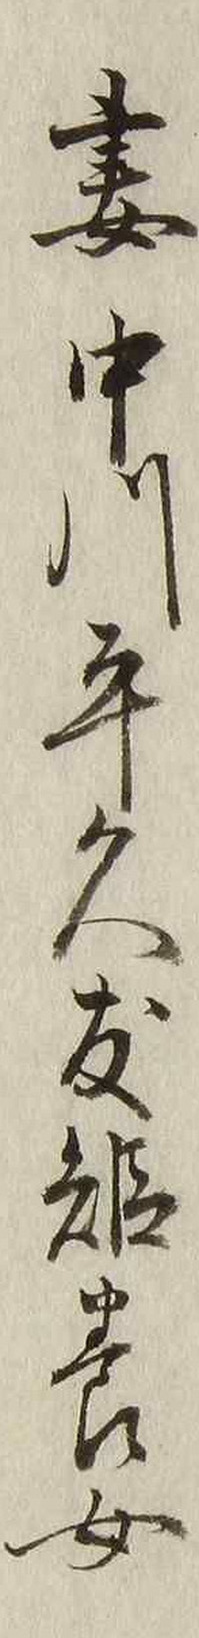妻中川平久友矩養女
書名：諸士系譜　巻之39　は之部7
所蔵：会津若松市立会津図書館
